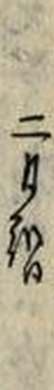二月朔日
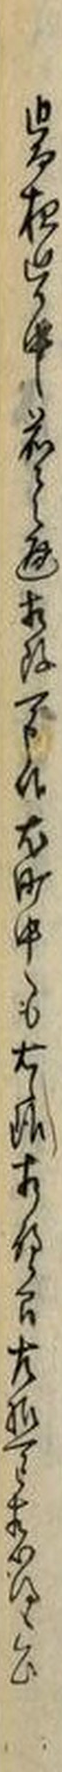追て夜廻り中前々之通相改可申候尤町中へも右之趣相触候間左様可被相心得候以上
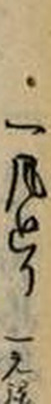一風廻り
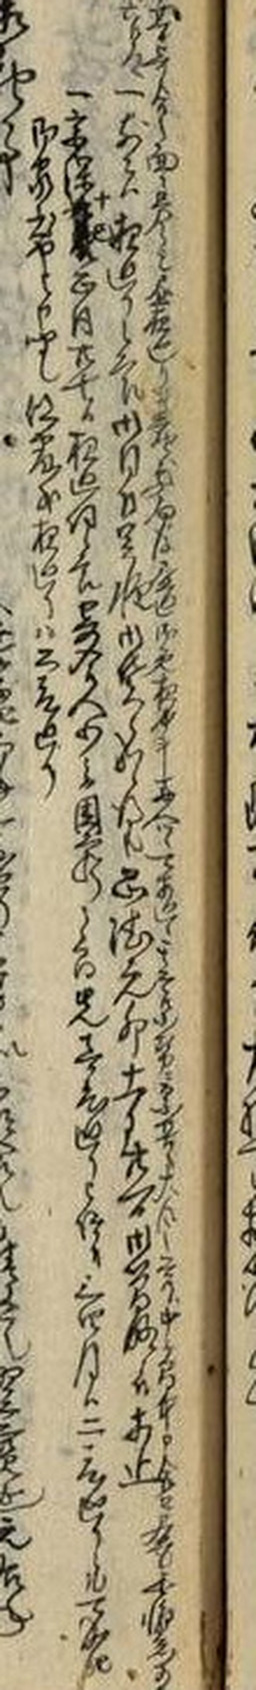一前々は夜廻り之節御目付足軽御貸被成候得共正徳元卯十一月廿一日御簡略に付相止
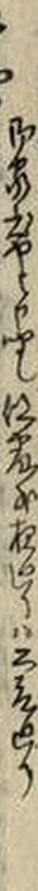御家老中被申聞候但番外夜廻りは二度廻り
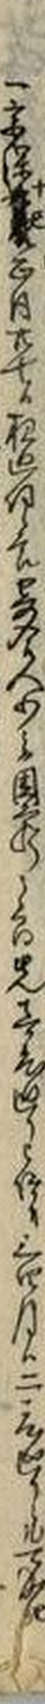一享保十巳正月廿七日夜廻伺之節寄合人少にて困窮候間先壱度廻り被仰付三四月は二度廻りにも可成由
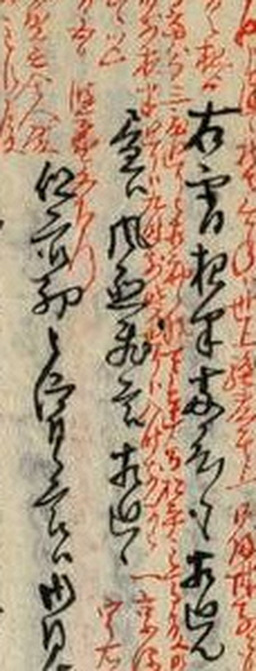昼は風烈敷節相廻候
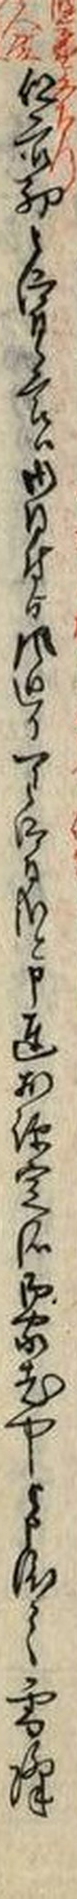但最初被仰付候節は御目付ゟ風廻り可被仰付哉と申達於評定所御家老中被申渡之雪降
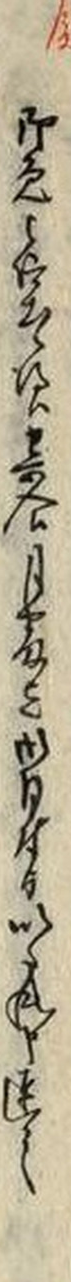御免被仰出候得は寄合月番迄御目付ゟ以手紙申達之
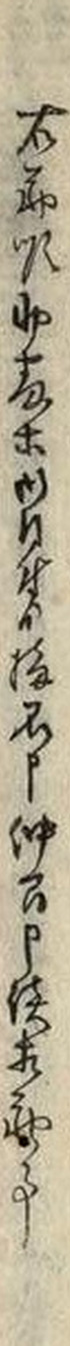右勤順助番等御目付ゟ構不申仲間申談相勤候事
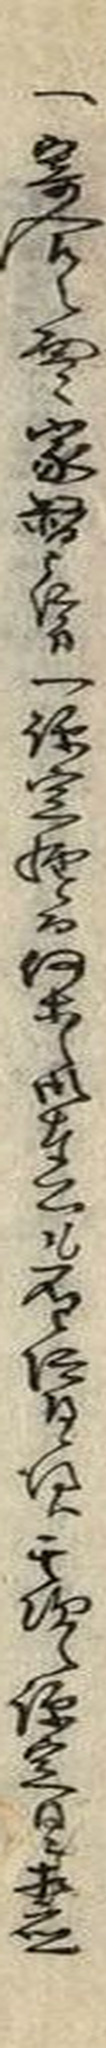一寄合之面々家督被仰付一評定経候て何等之御奉公も不被仰付候得は其次之評定日に相応
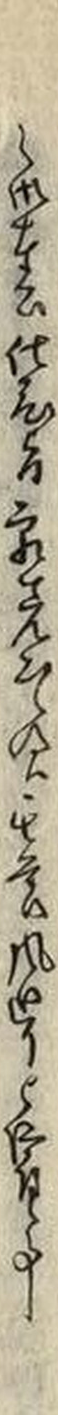之御奉公仕度旨願差出候得は其節風廻り被仰付候事
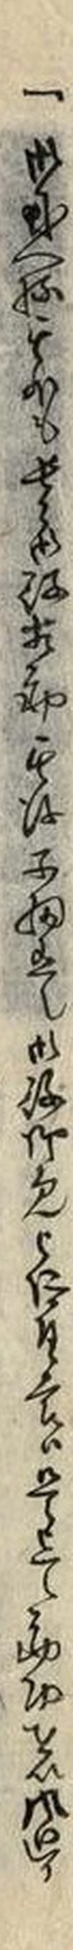一御用人抔其外も長々御役相勤其後子細有之御役御免被仰付候節は是迄之勤功を以風廻り
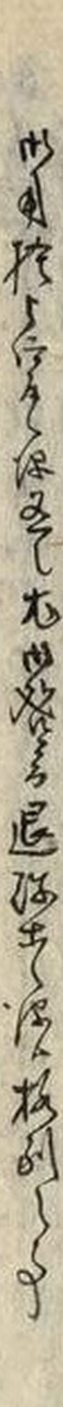御用捨被仰付候儀有之尤御咎にて退役等之儀は格別之事
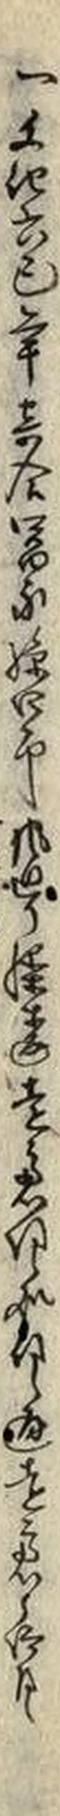一文化六巳年寄合富永孫四郎風廻り繰違遠慮伺候処伺之通遠慮被仰付候
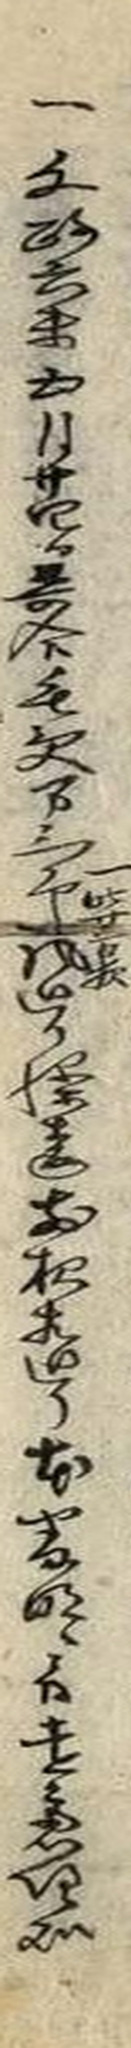一文政六未五月廿四日寄合毛受万三郎一昨廿一日夜風廻り繰違前夜相廻り本番明候に付遠慮伺候処
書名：御城下諸事之部
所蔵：福井県文書館 Fukui Prefectural Archives
